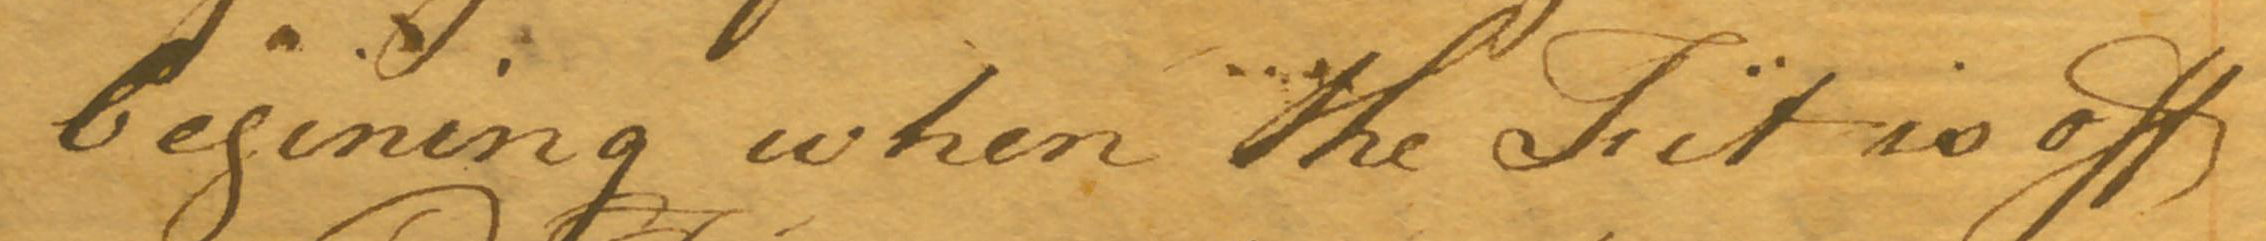beginning when the Fit is off
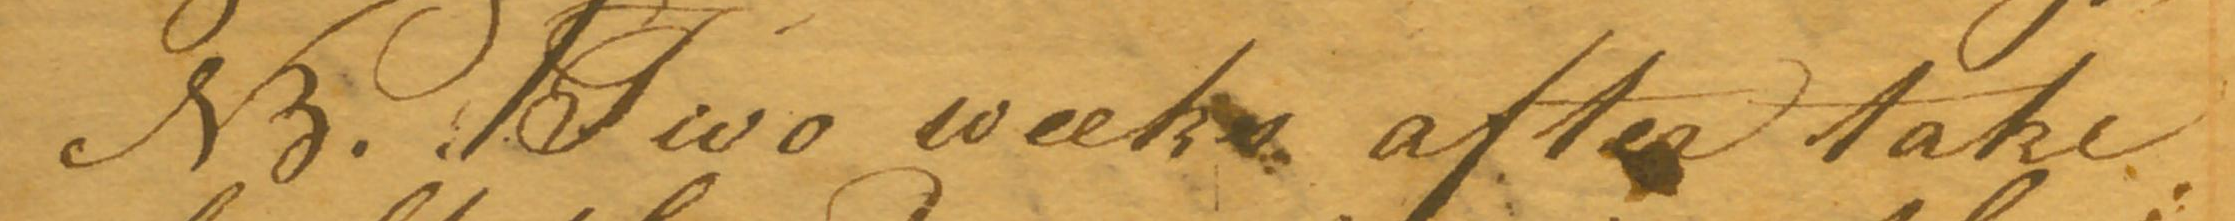NB. Two weeks after take
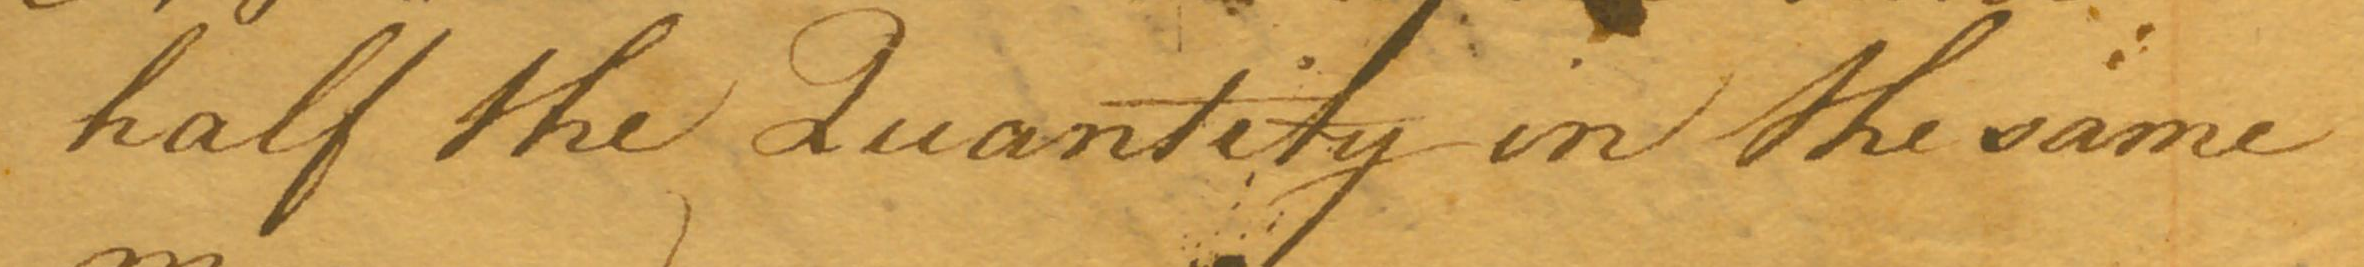half the Quantity in the same
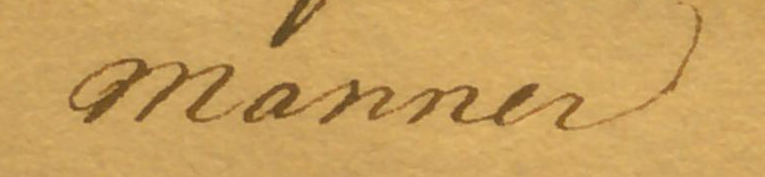manner
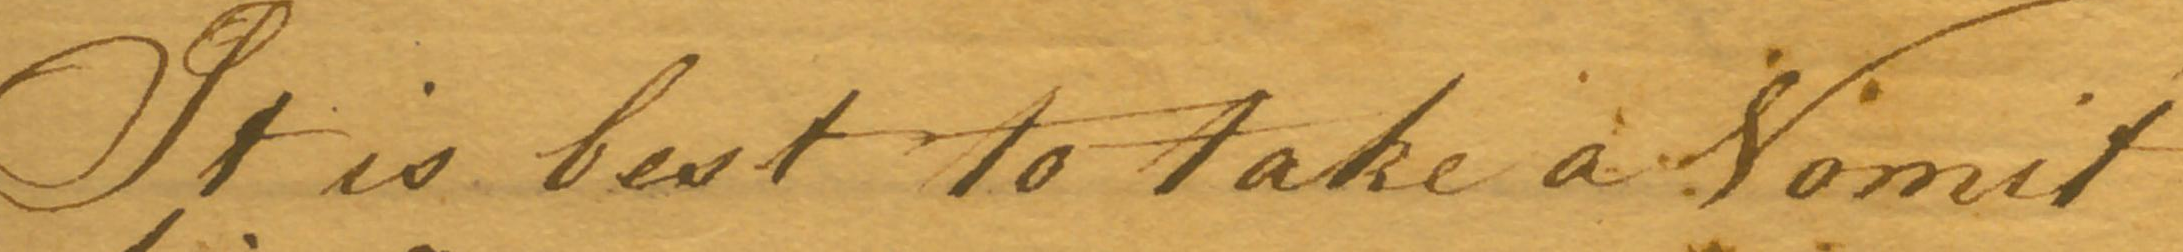It is best to take a Vomit
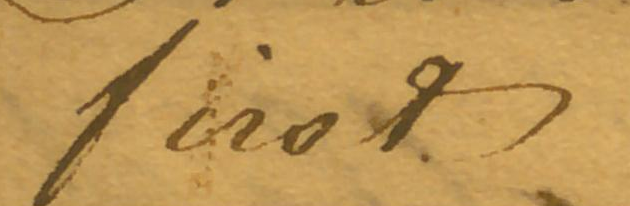first.
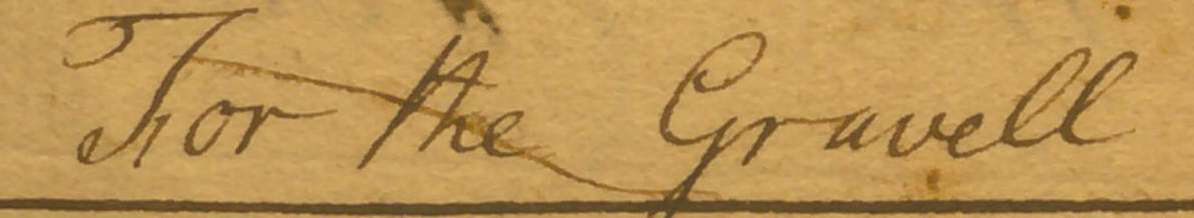For the Gravell
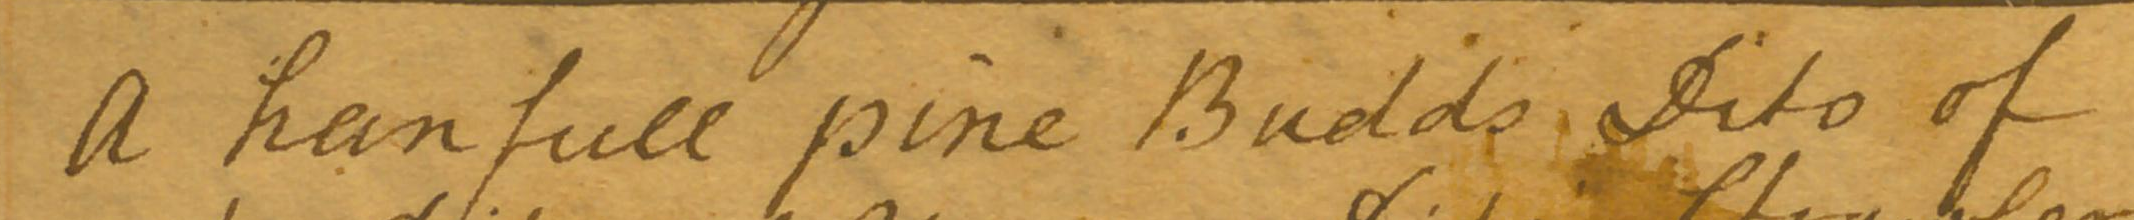A hanfull ppine Budds Dito of
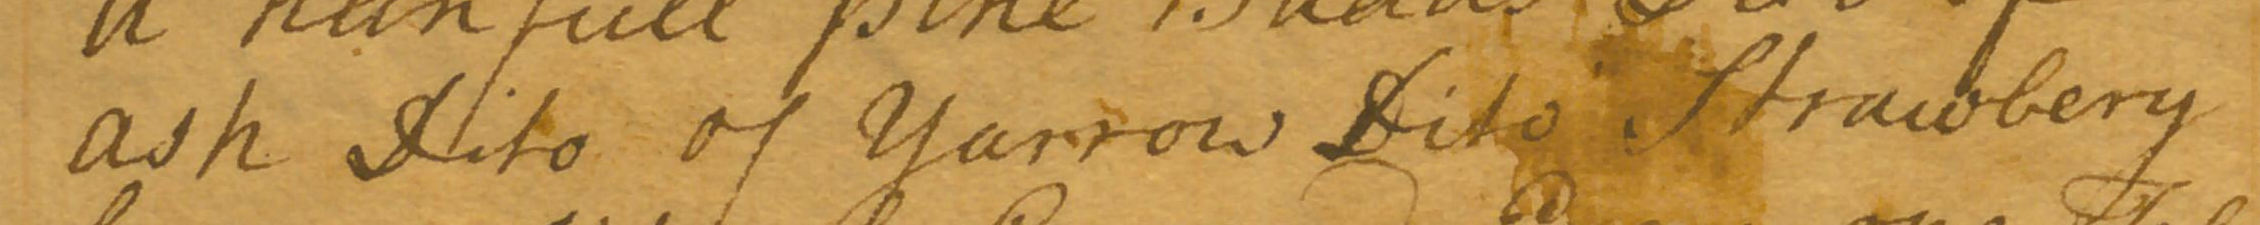ash Dito of Yarrow Dito Strawberry
